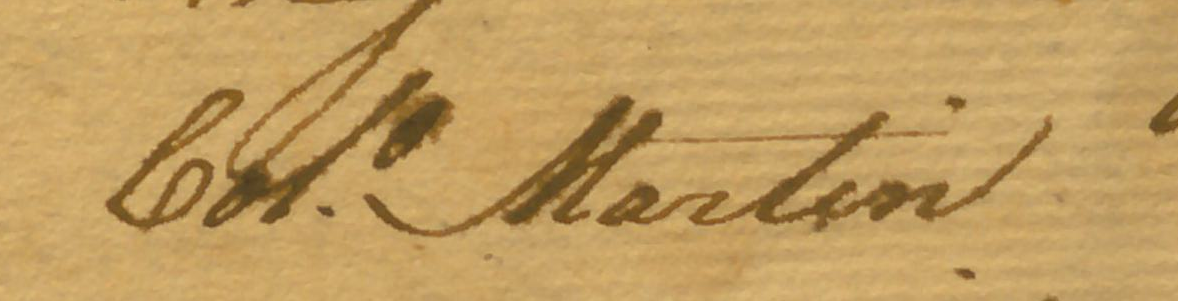Col^o. Martin
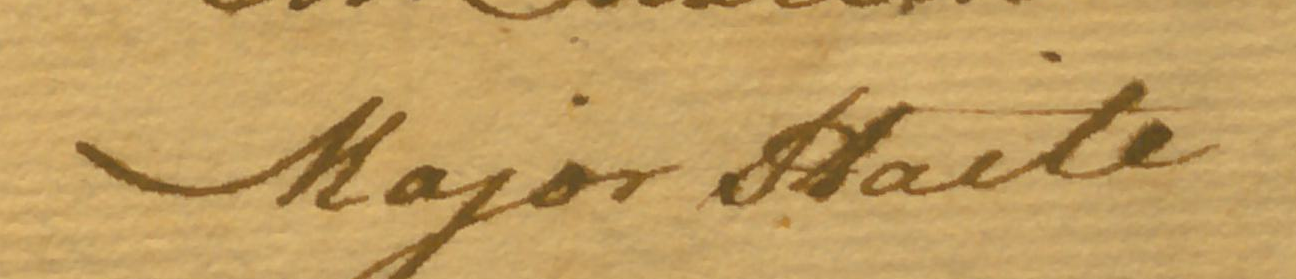Major Haite
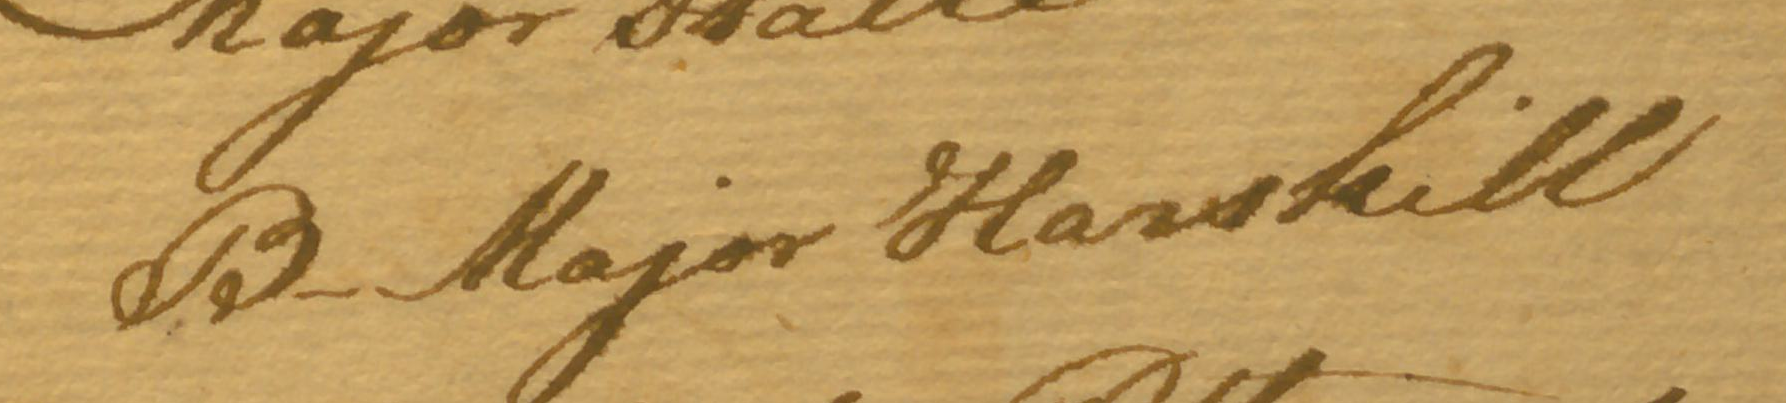B. Major Harskill
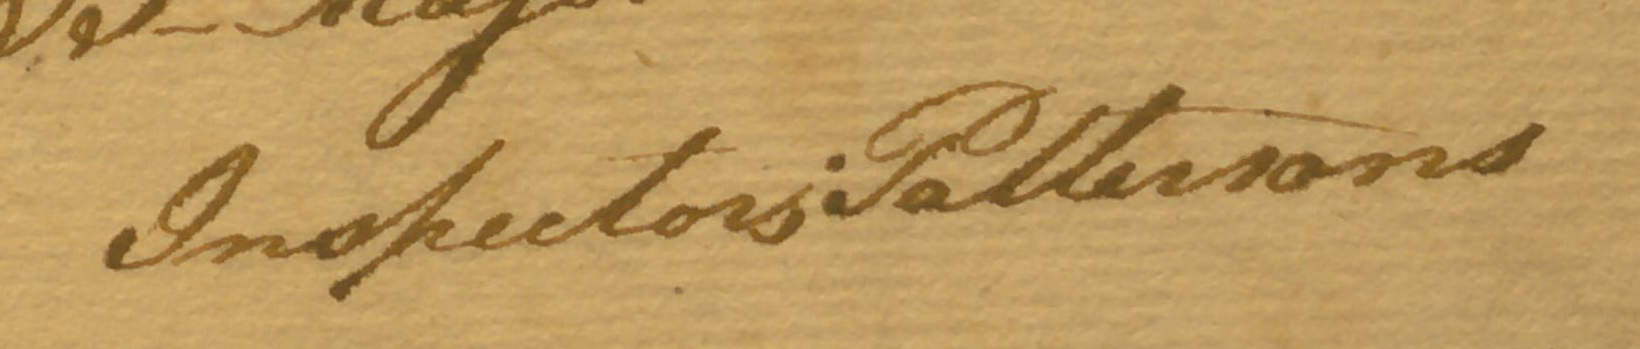Inspectors Pattersons
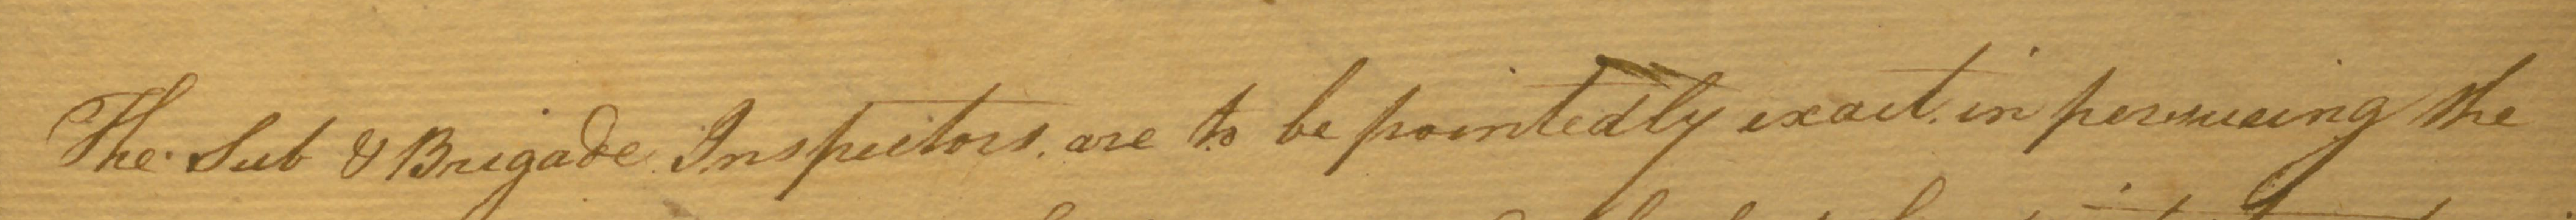The sub & Brigade Inspectors are to be pointedly exact in pursuing the
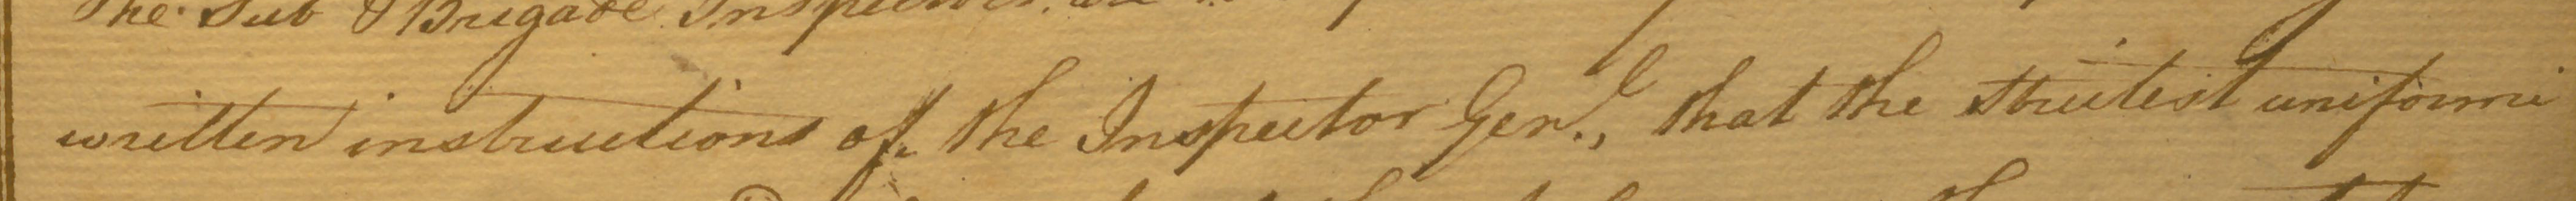written instructions of the Inspector Gen^l., that the strictest uniform
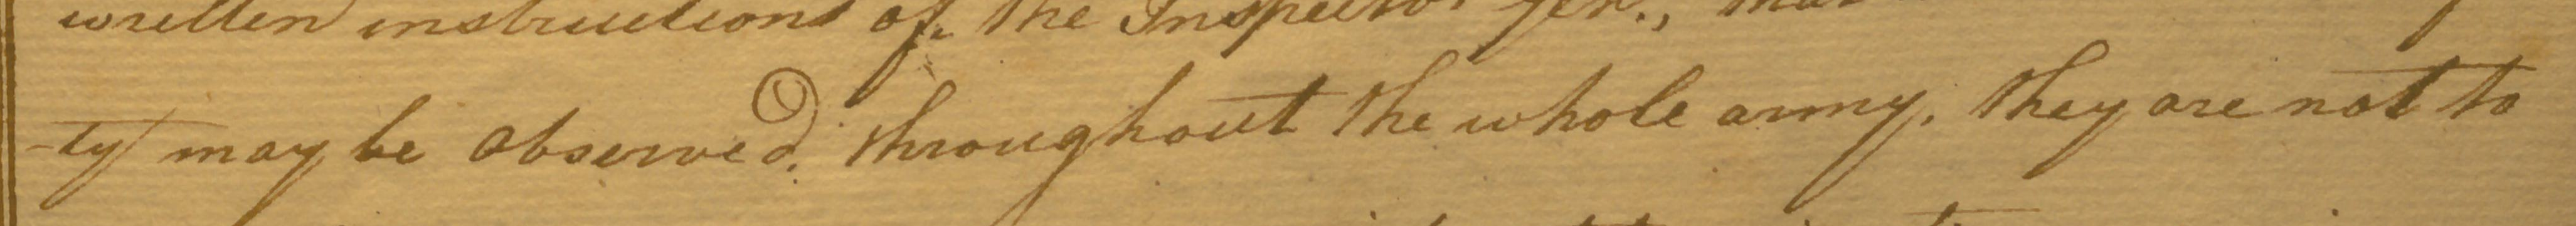-ty may be observ'd throughout the whole army, they are not to
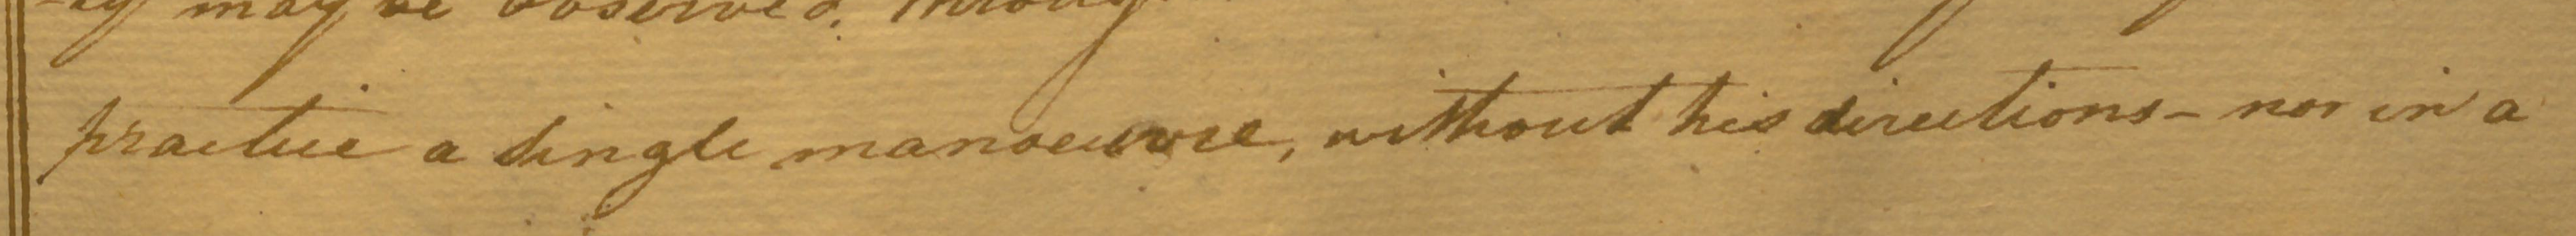practice a single manoeuvre, without his directions- nor in a
